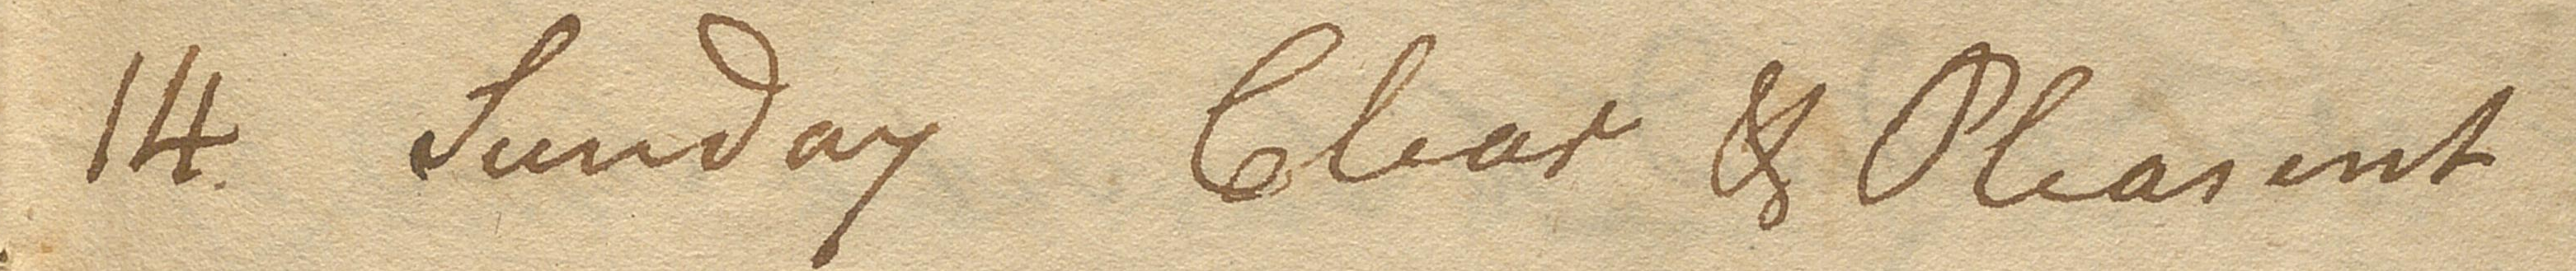14 Sunday Clear & Pleasent
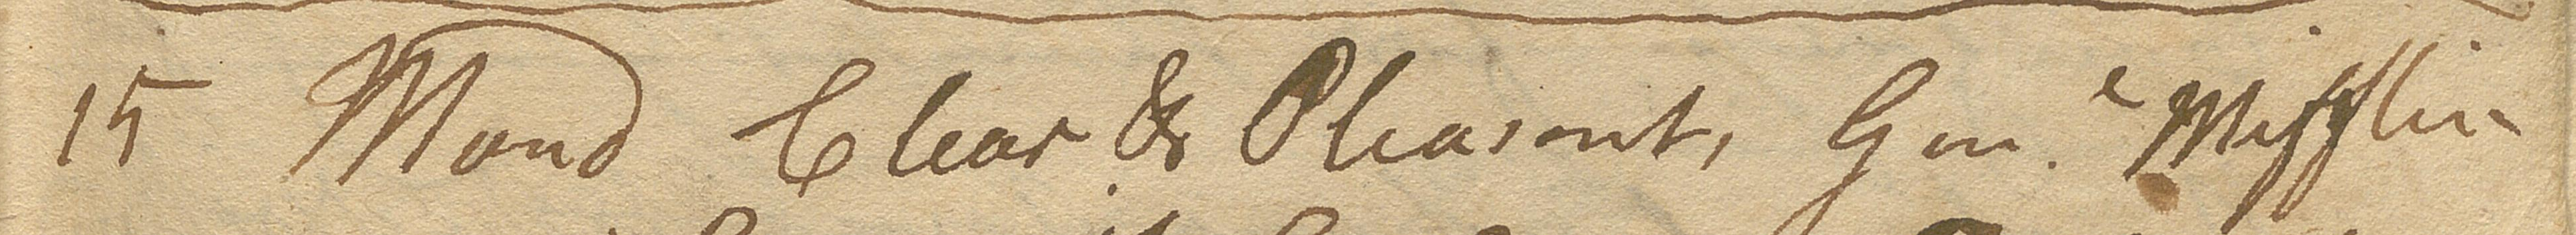14 Mond Clear & Pleasent, Gen^l. Mifflin
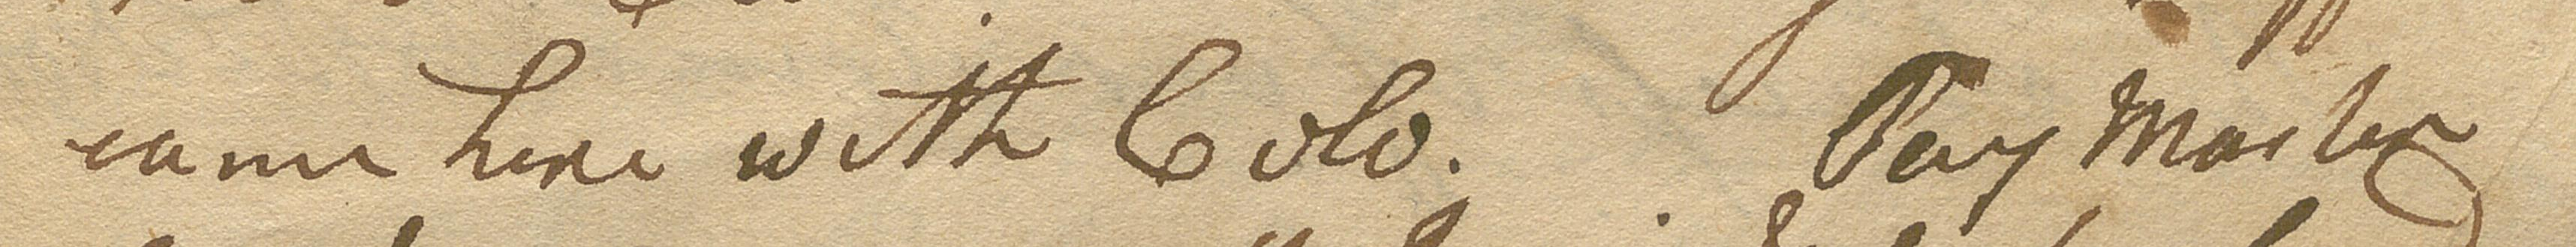came here with Colo. Pay Marle
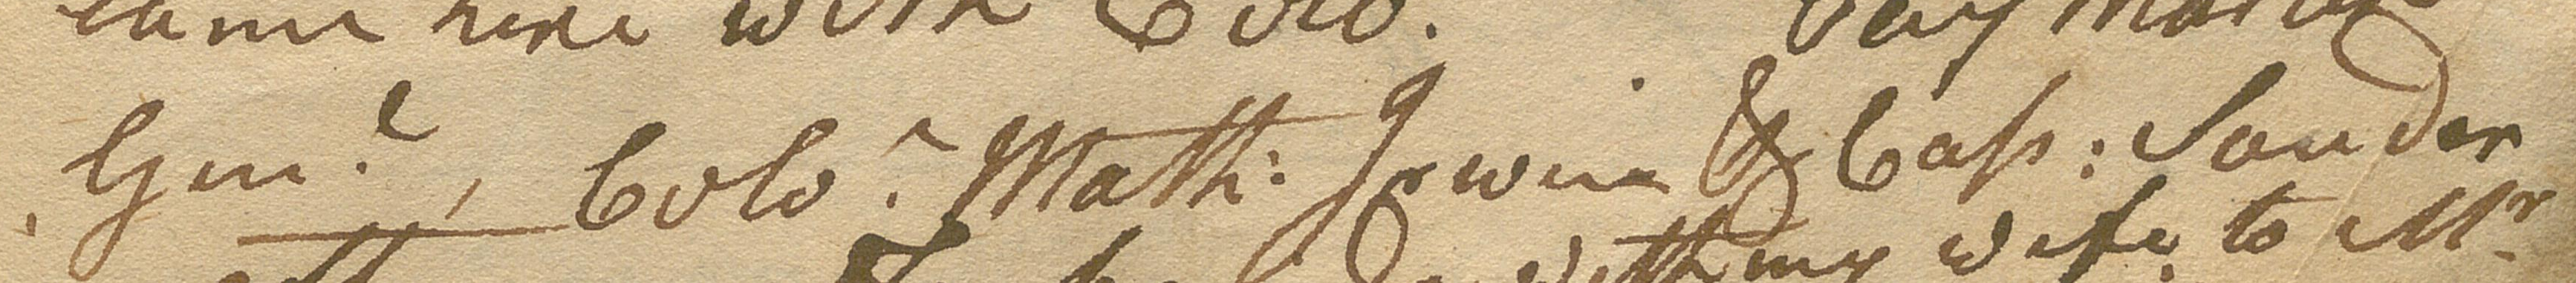Gen^l., Colo^l. Math: Irwin & Cap: Souder
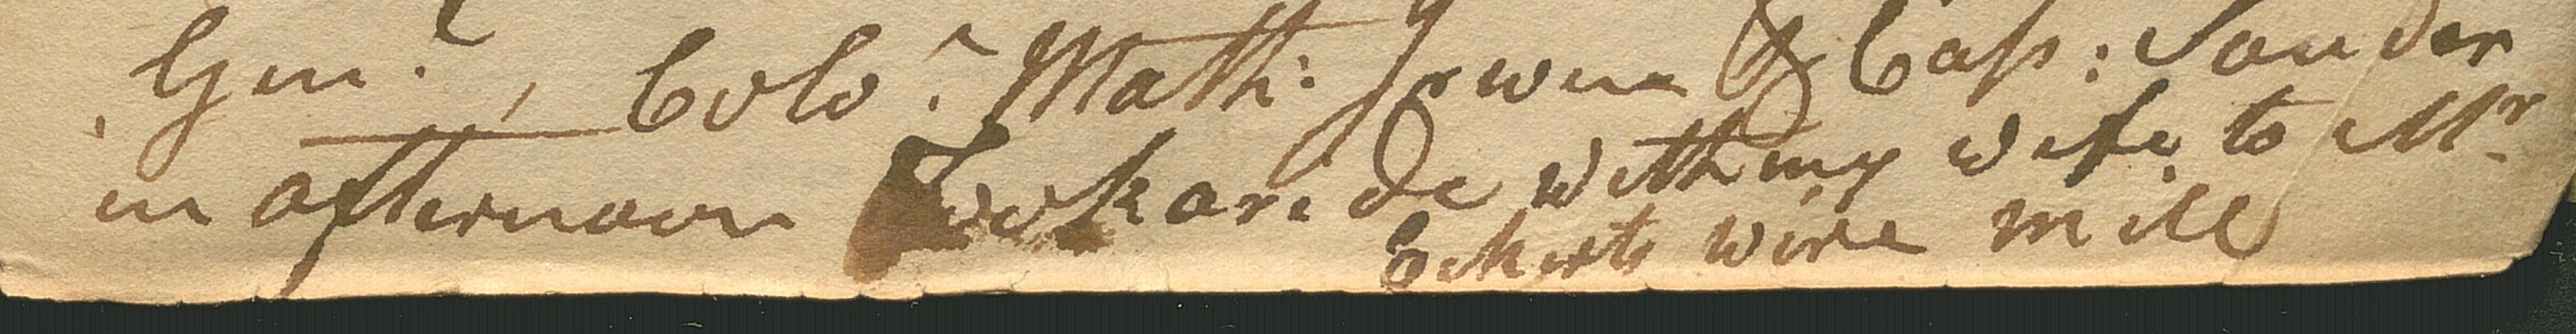in afternoon Toop a ride with my wife to M^r.
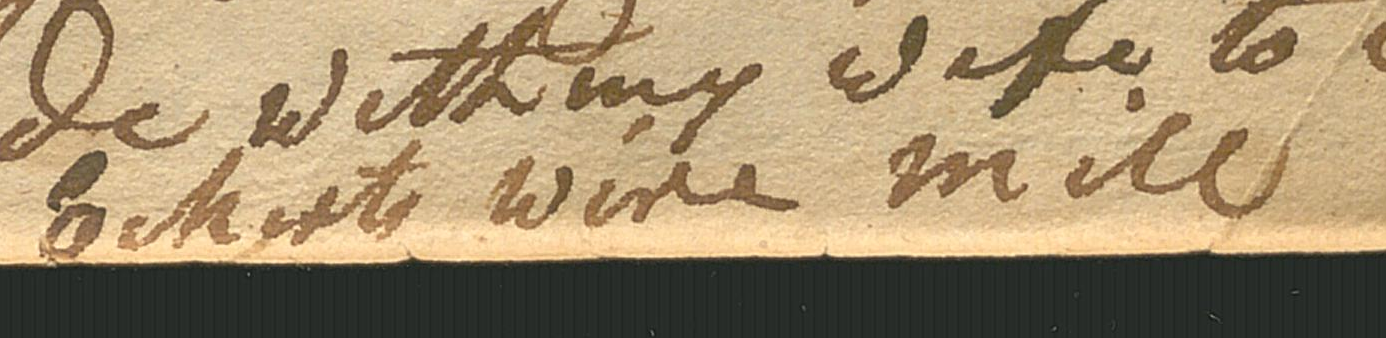Eekerts wine mill
